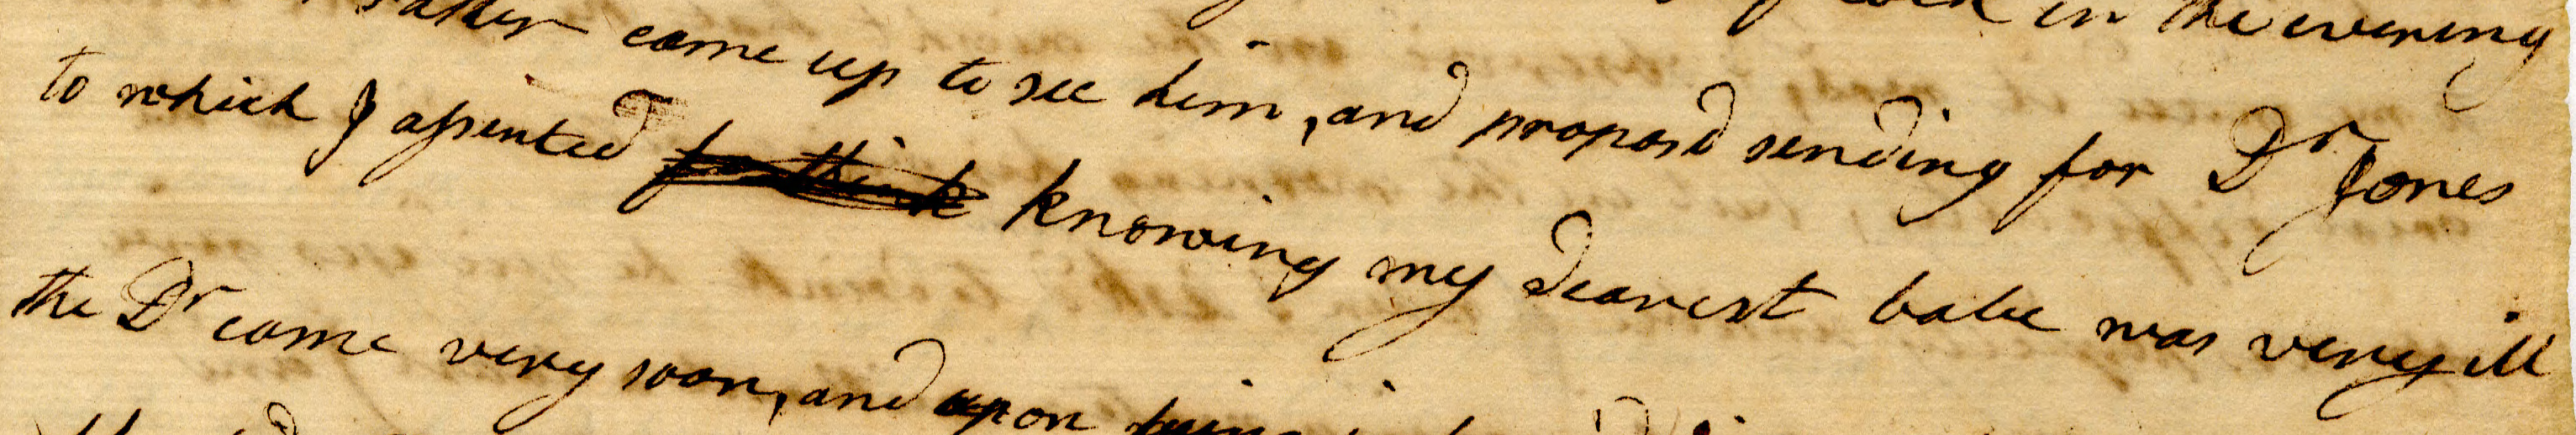to which I assented [for think] knowing my dearest babe was very ill
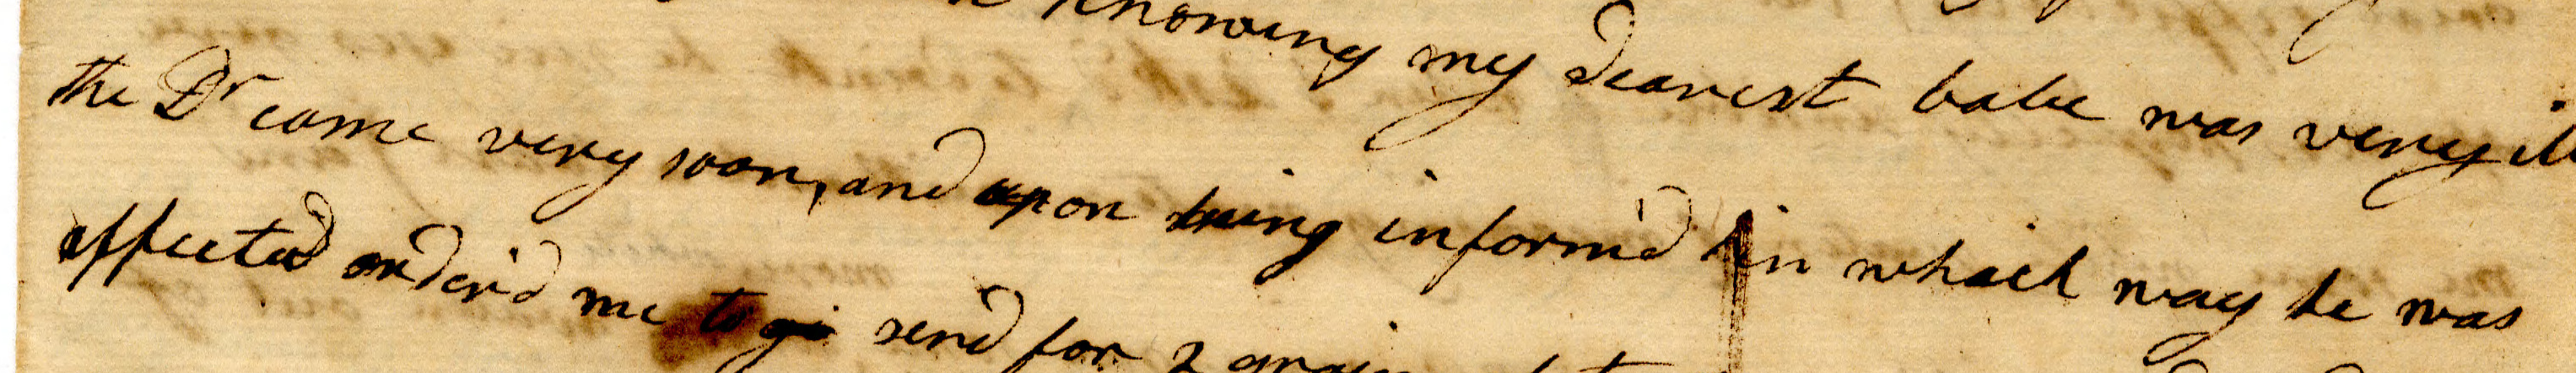the D^r came very soon, and upon being inform'd in which way he was
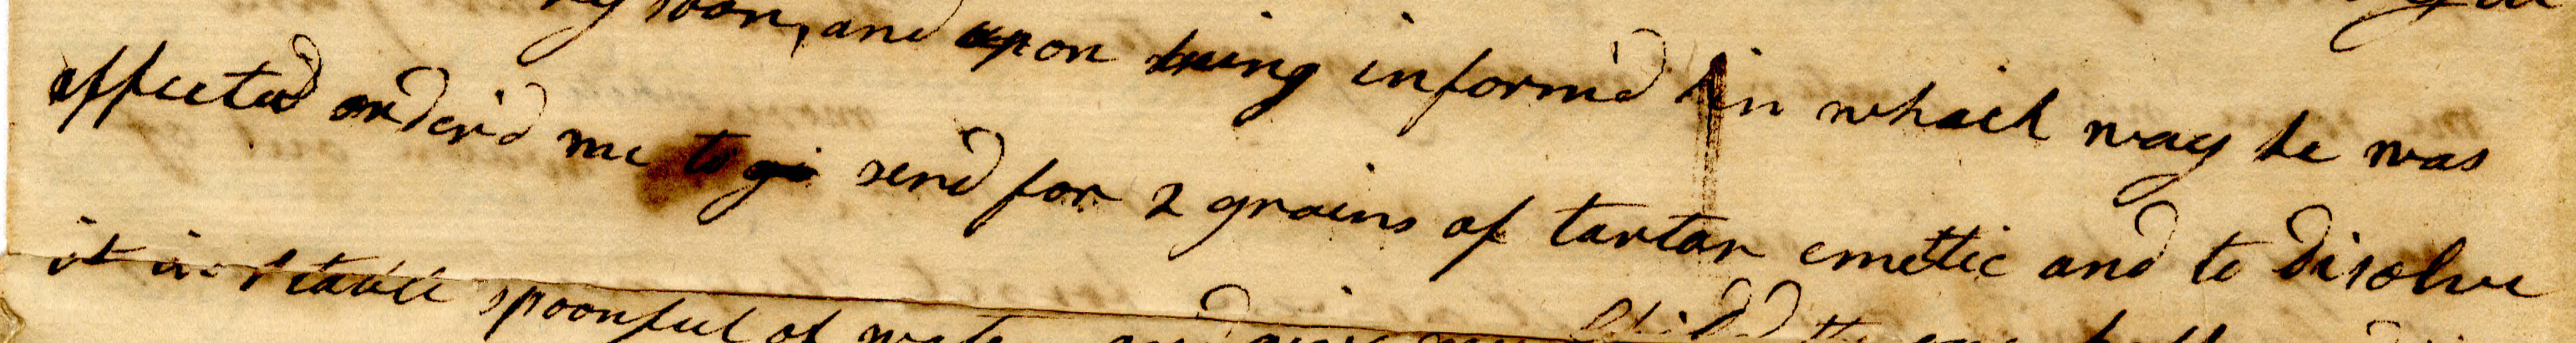affected order'd me to go send for 2 grains of tartar emetic and to disolve
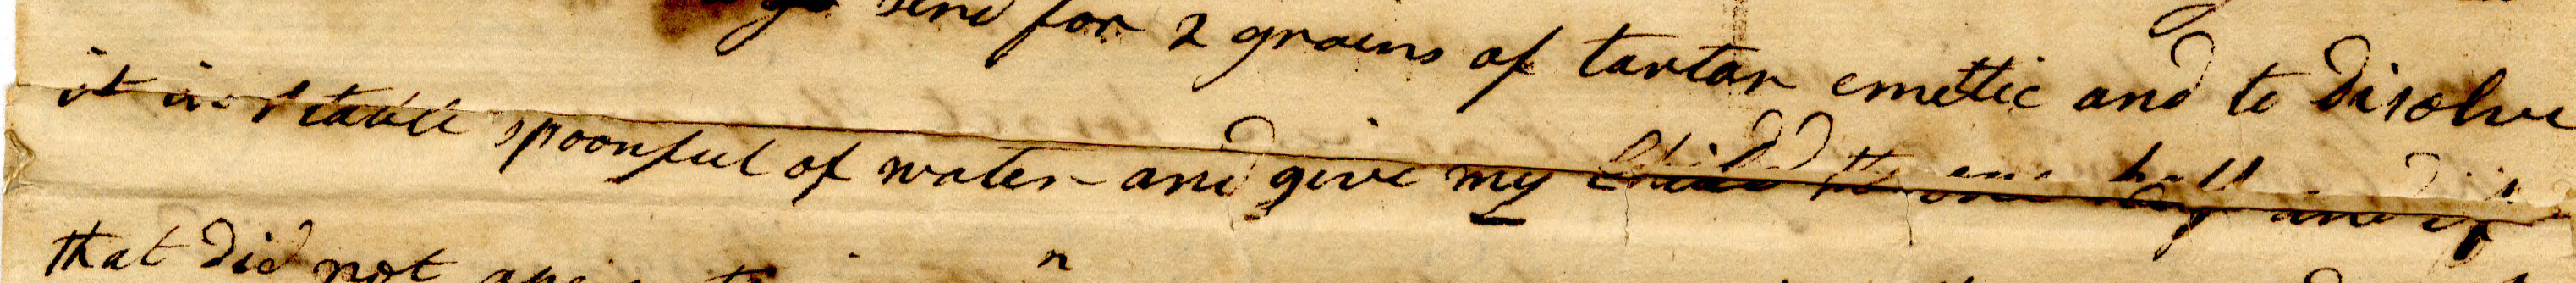it in 1 table spoonful of water- and give my Child the one half and if
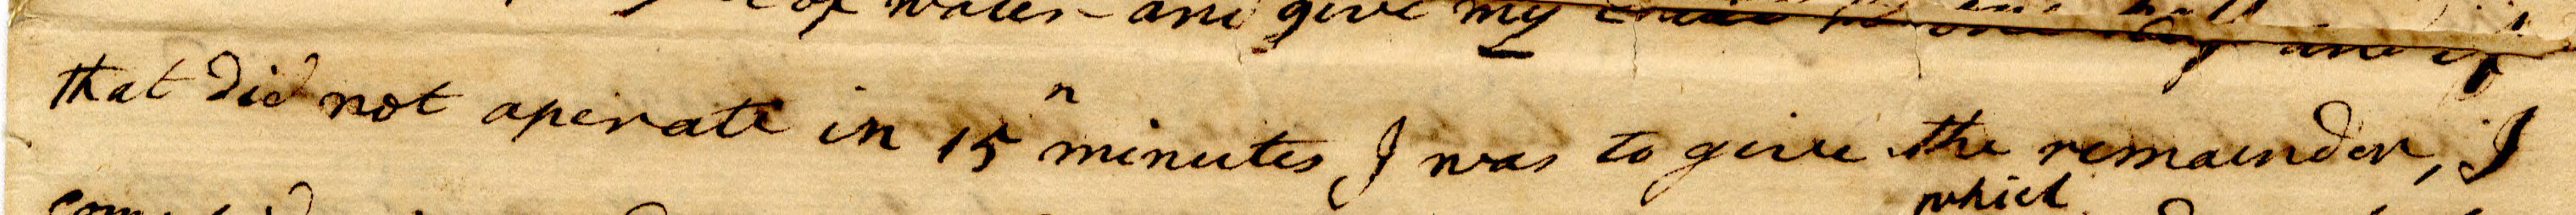that did not operate in 15 minutes I was to give the remainder, I
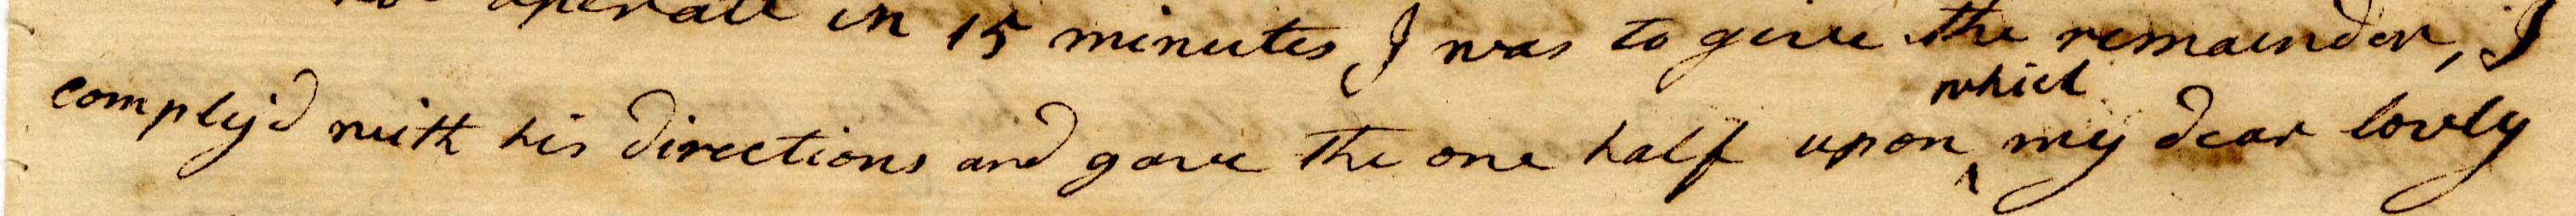comply'd with his directions and gave the one half upon ^ my dear lovly
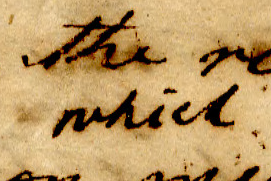which
